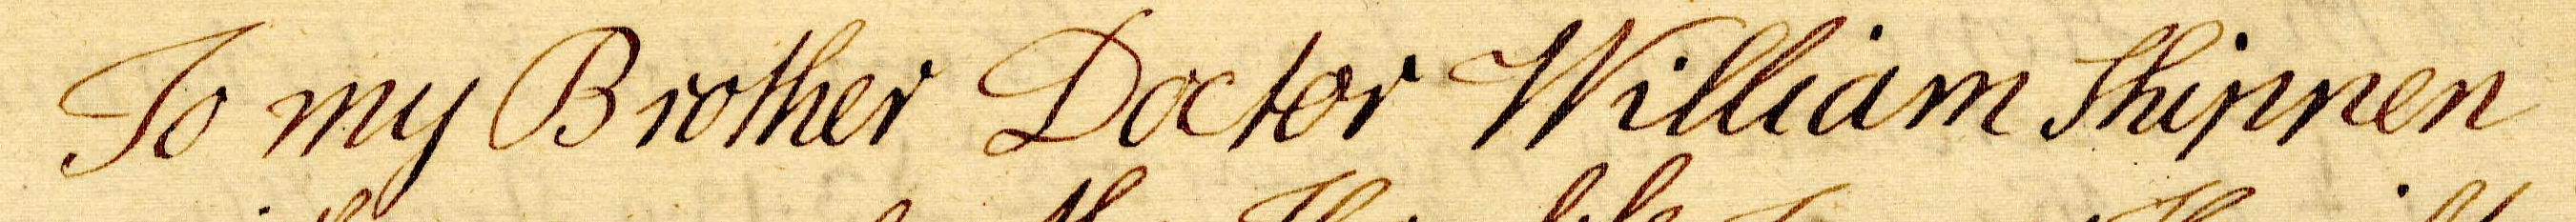To my Brother Doctor William Shippen
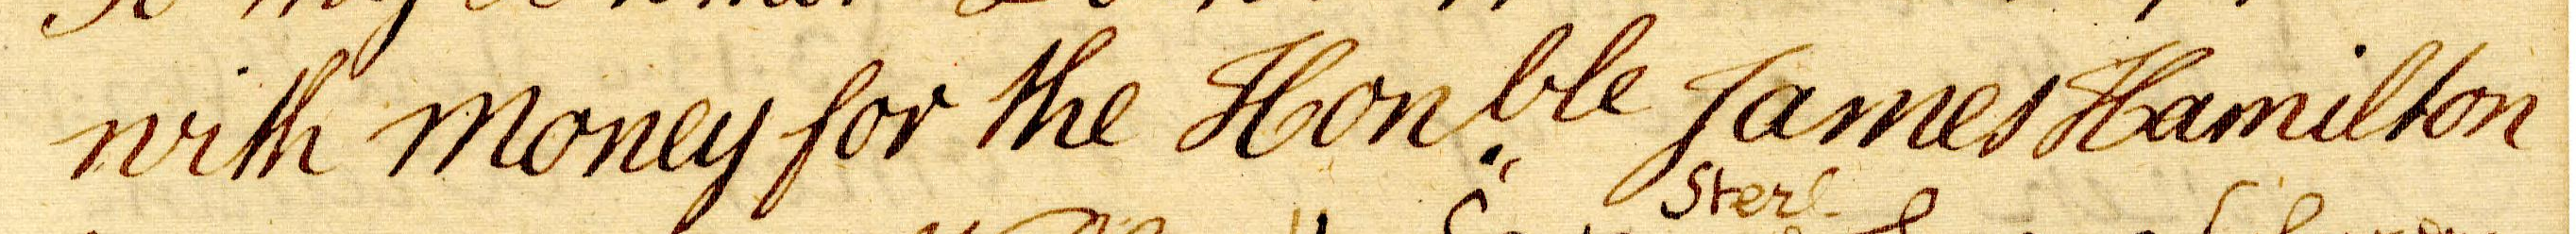with M\oney for the Hon^ble James Hamilton
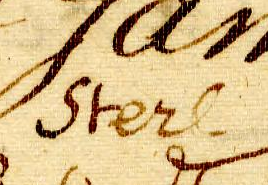Sterl
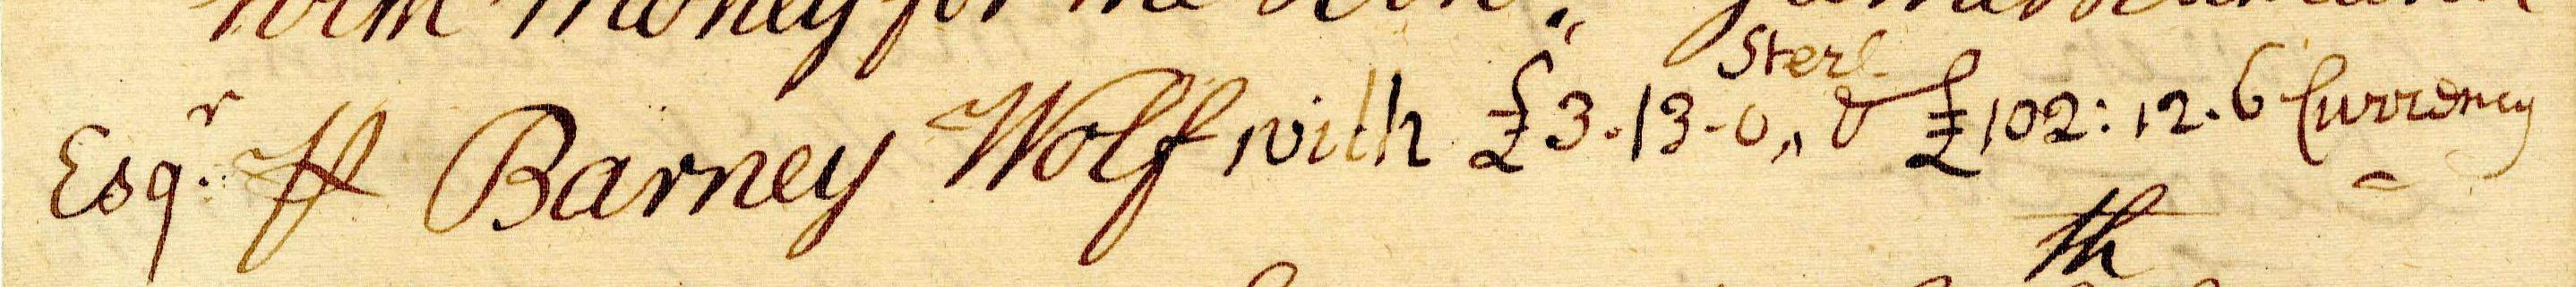Esq.^r per Barney Wolf with £3.13.0 ^ & £102..12.6 Currency
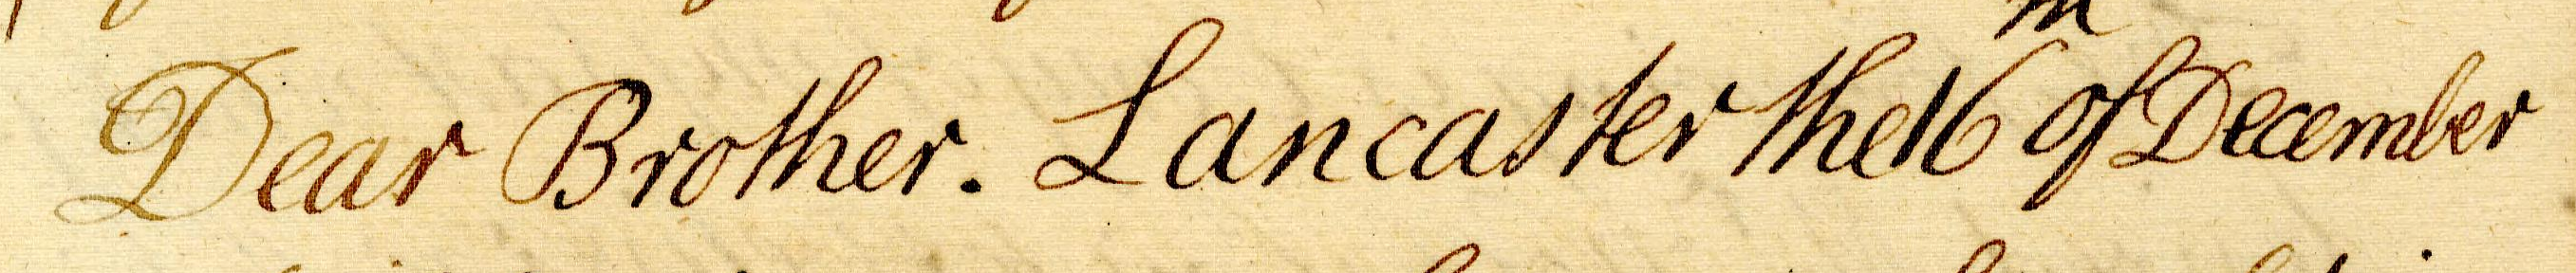Dear Brother. Lancaster the 16^th of December
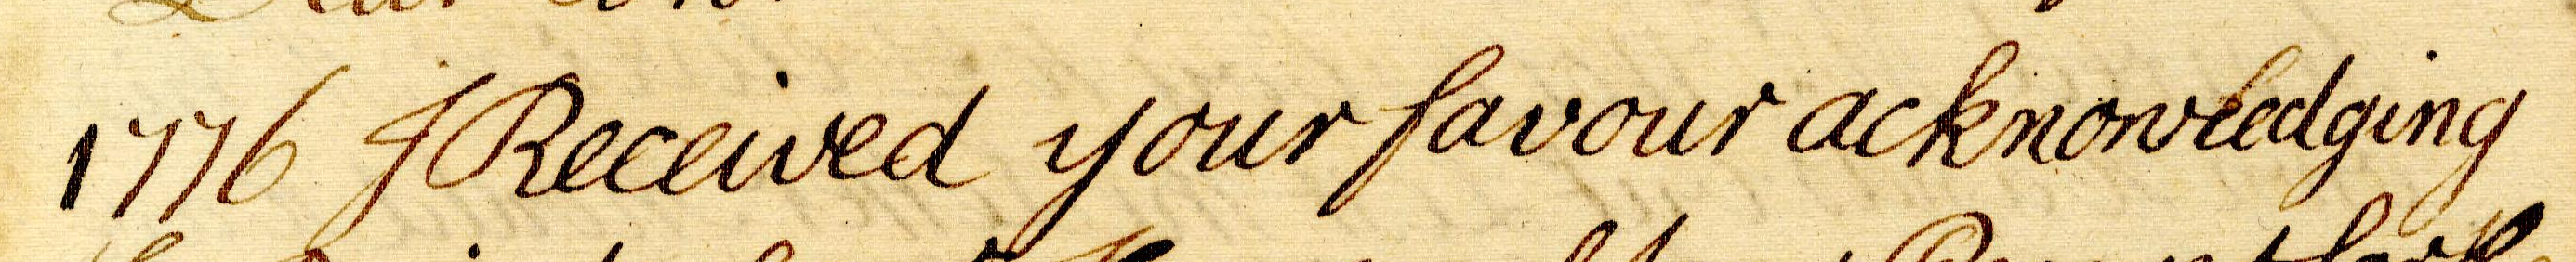1776 I Received your favour acknowledging
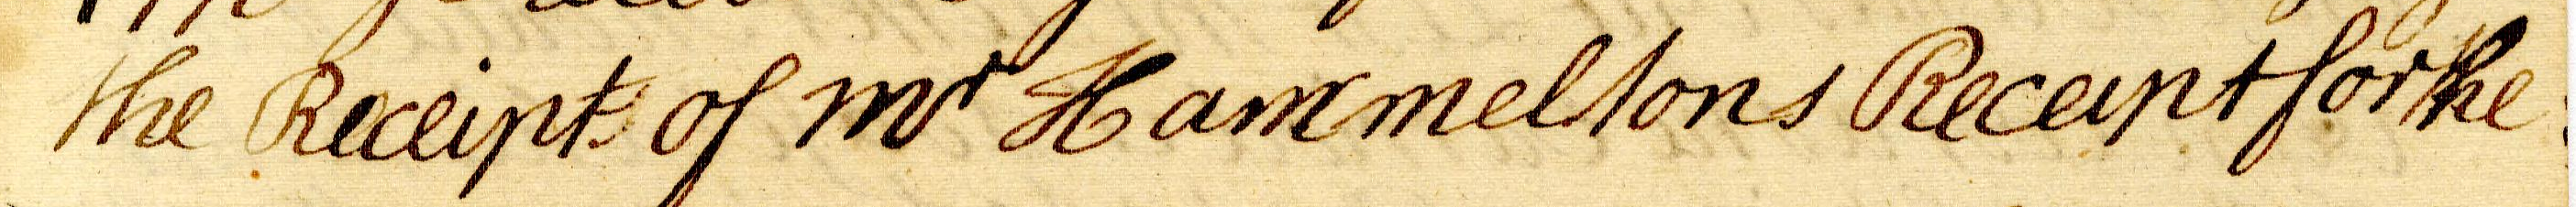the Receipt of M^r Hammeltons Receipt for the
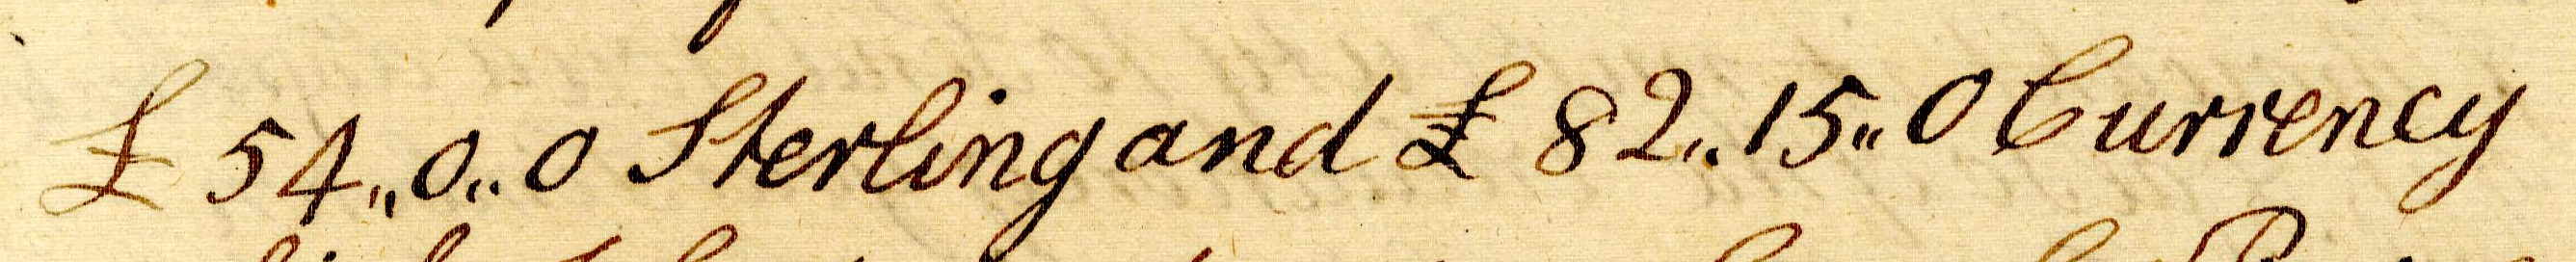£54..0..0 Sterling and £82..15..0 Currency
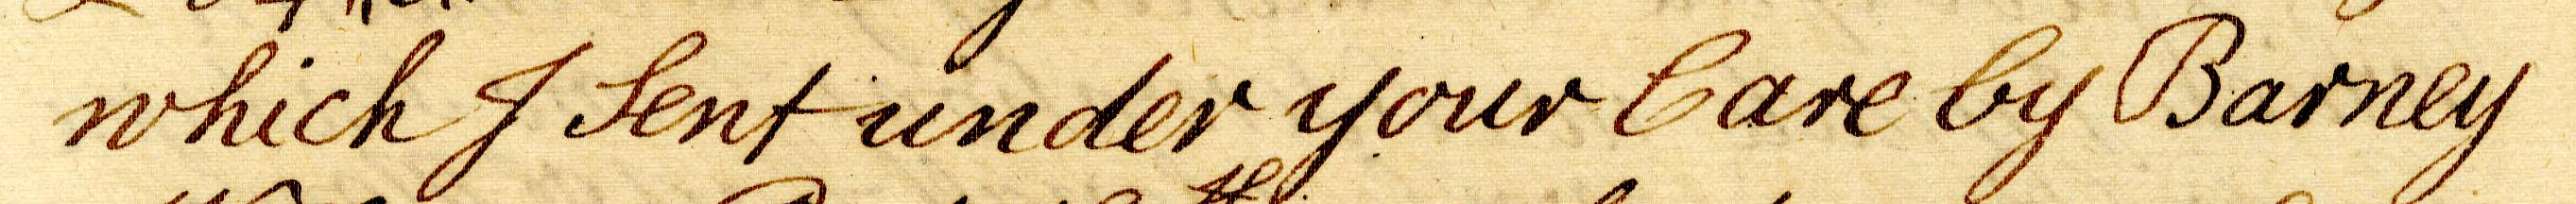which I Sent under Your Care by Barney
